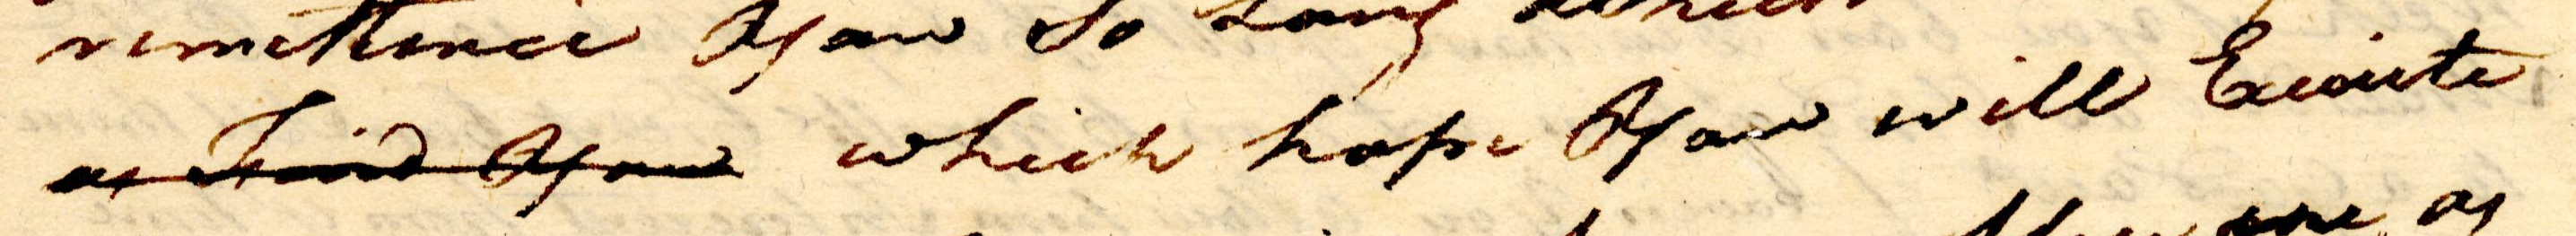[_________] which hope you will Excute
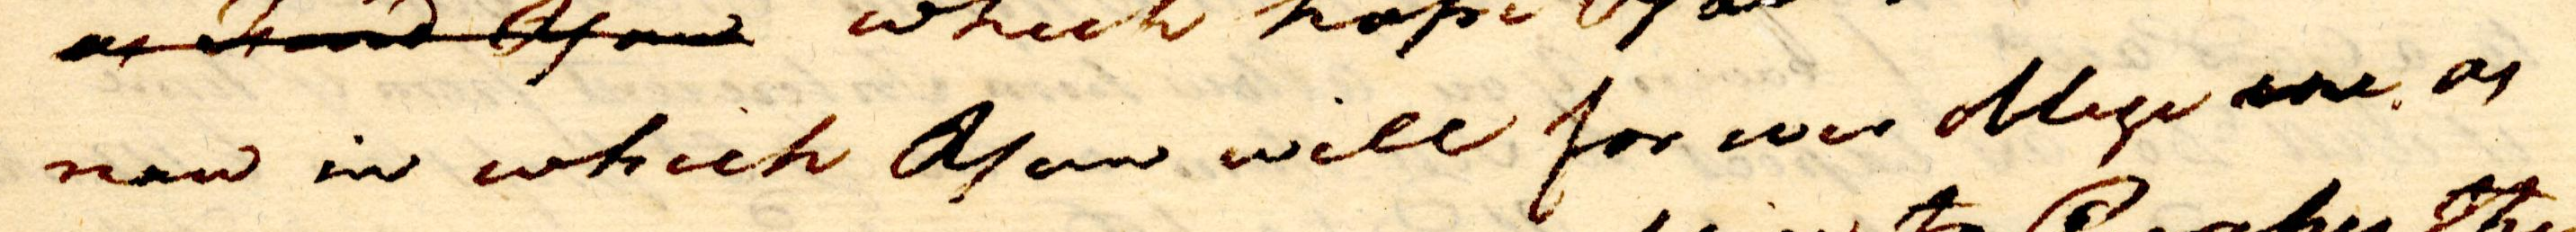now in which you will for us oblige [___]. as
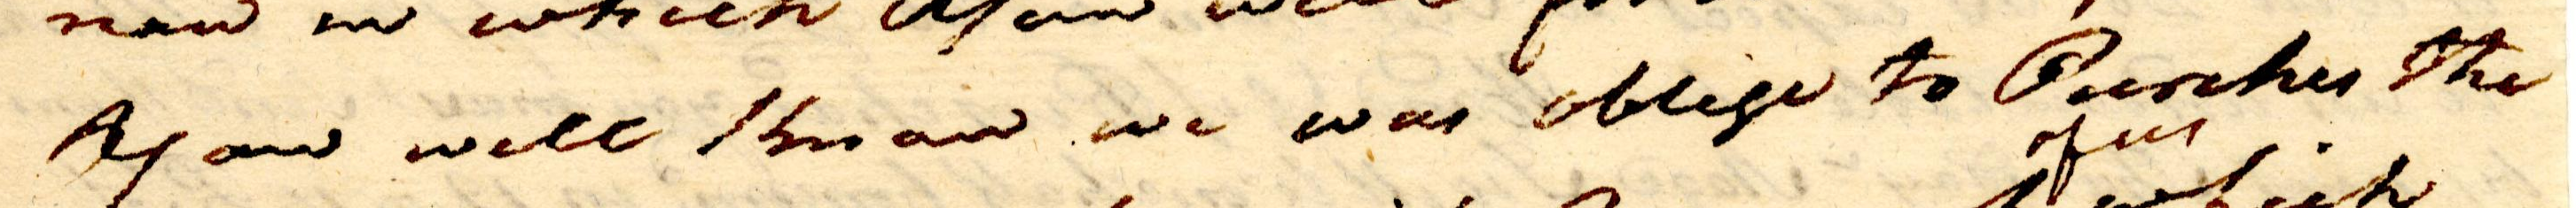your well know we was oblige to Purches The
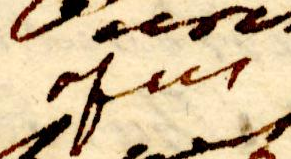of us
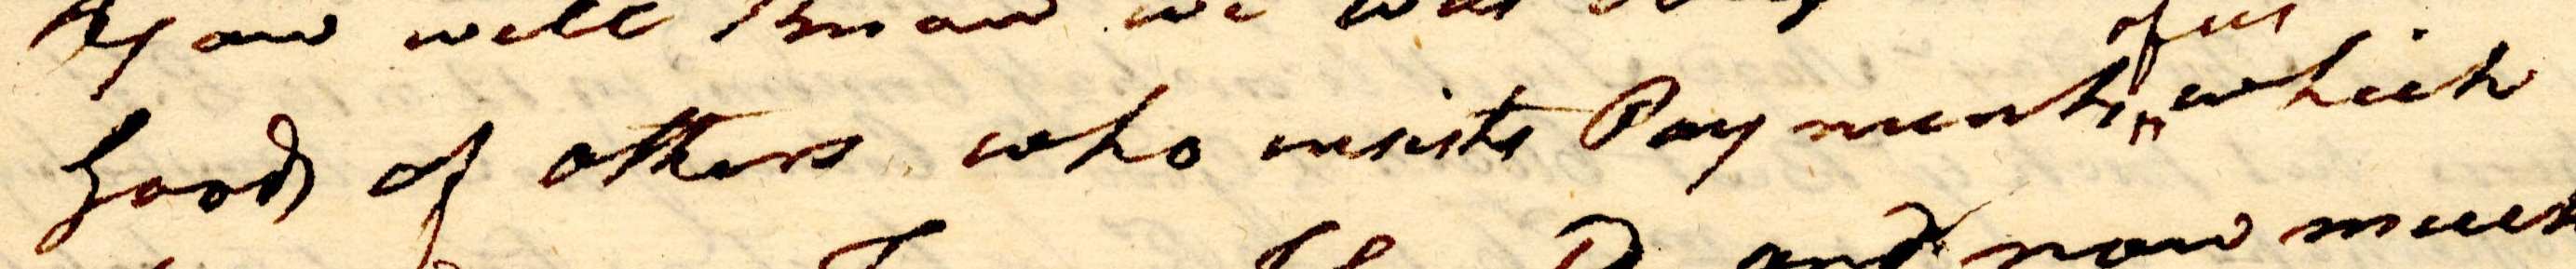goods of others who resists Payments ^, which
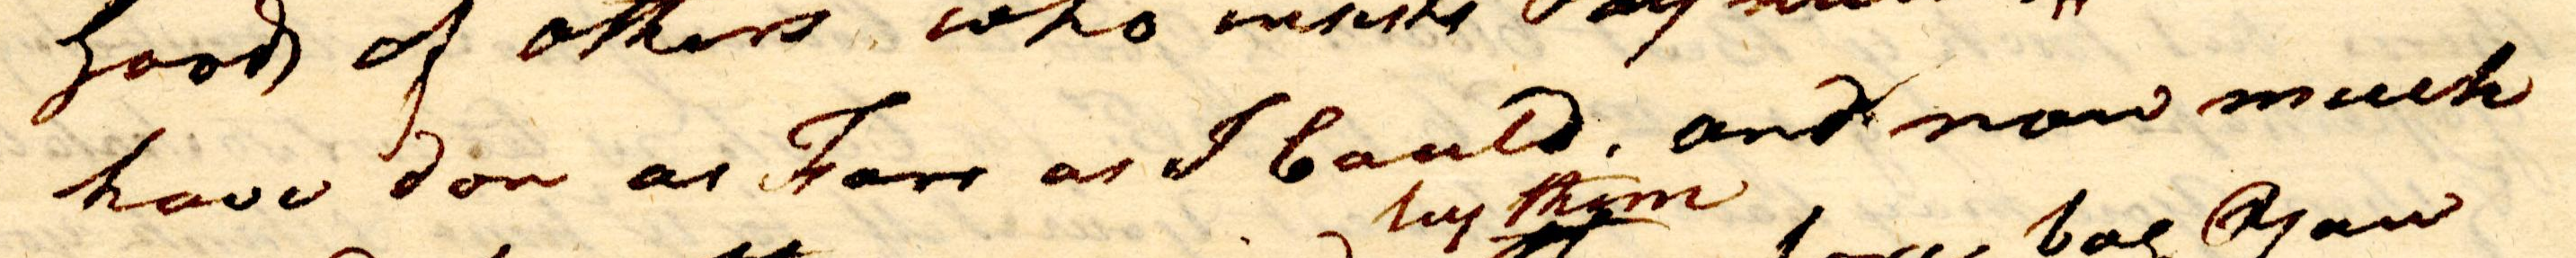have don as Farr as I Cauld, and now much
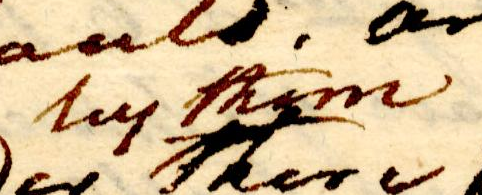by them
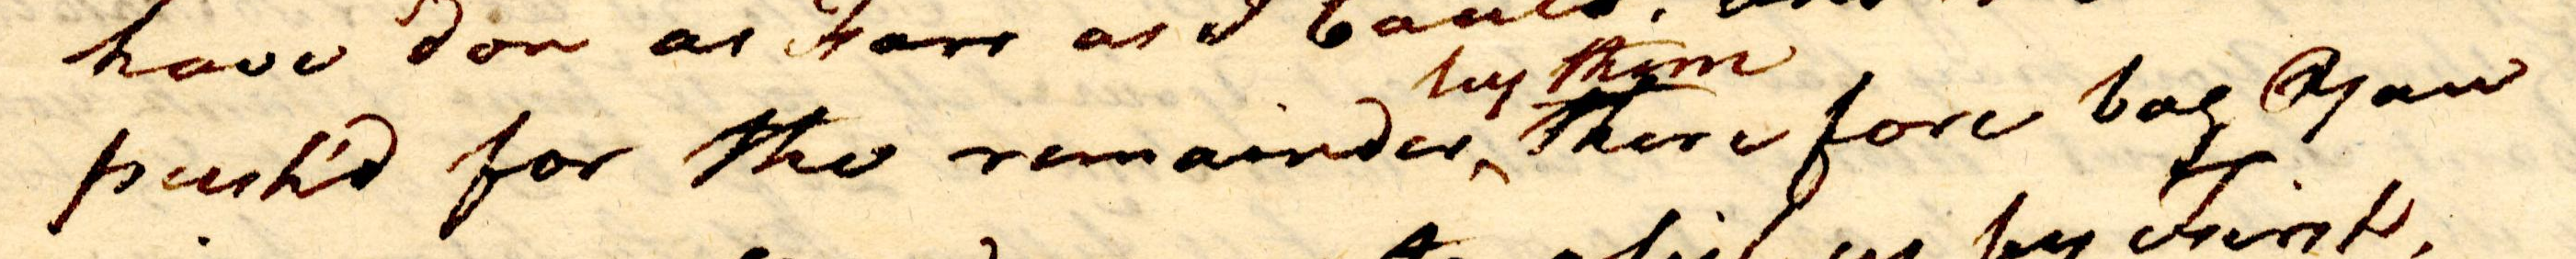push'd for the remainder ^ therefore beg you
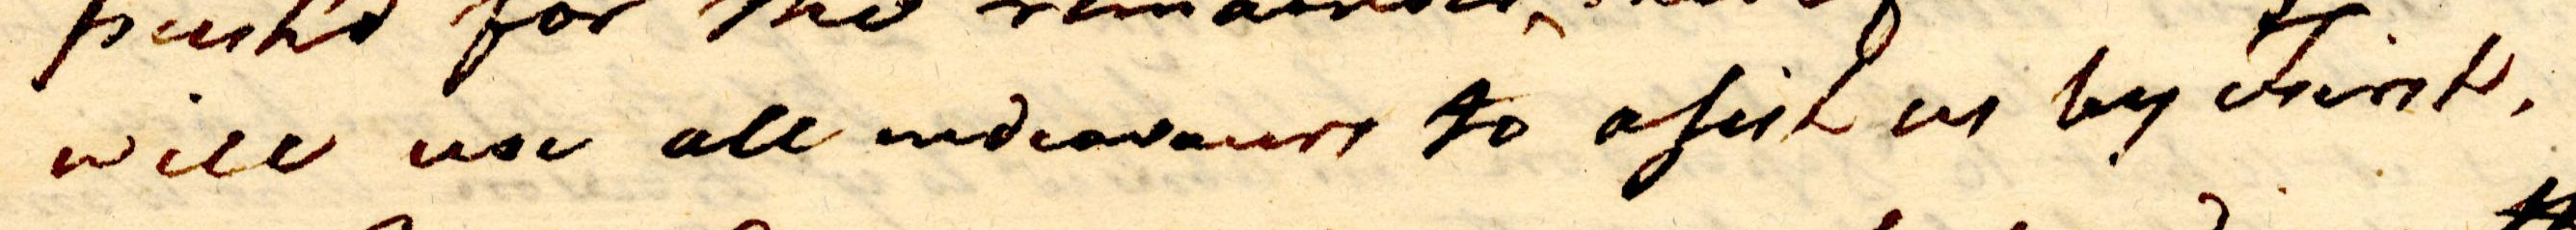will use all endeavaurs to asist us by First.
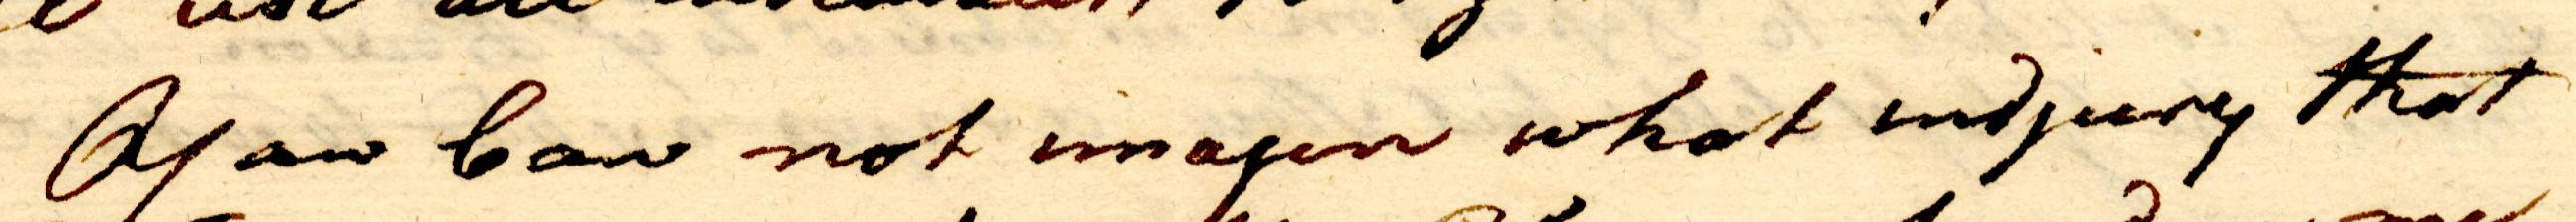You Can not imagen what indjury that
